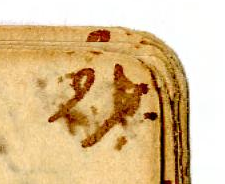27
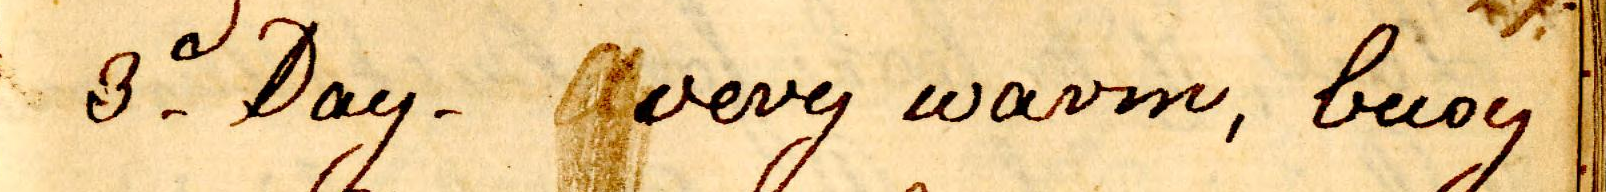3^d. Day- A very warm, busy
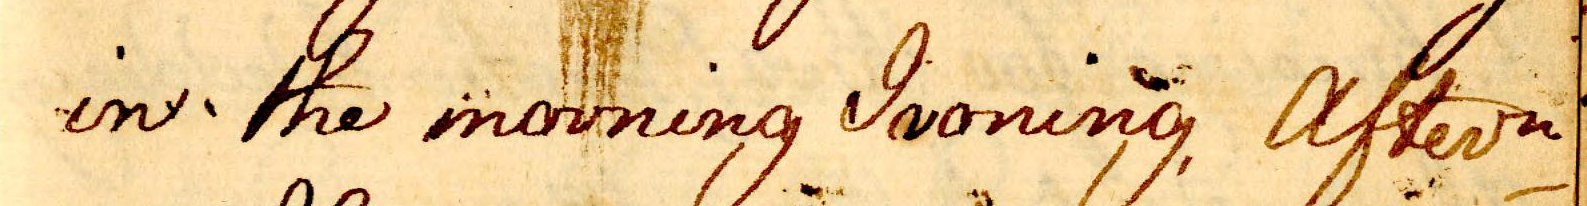in the morning Ironing, After
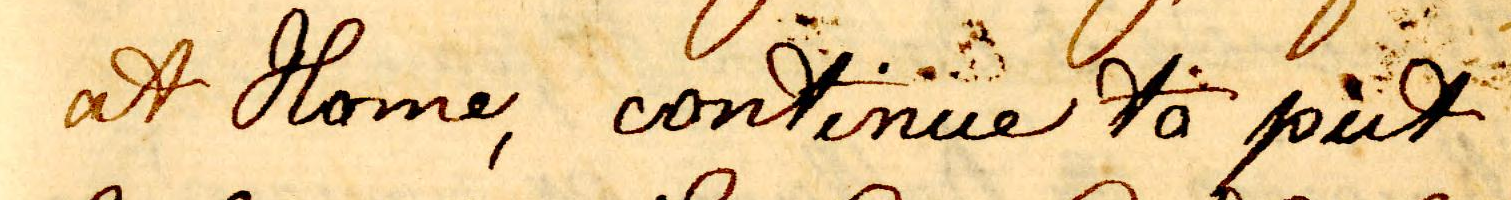at Home, continue to put
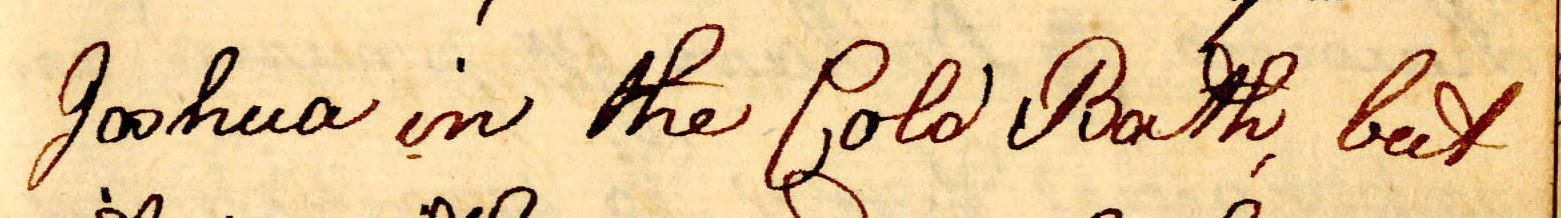Joshua in the Cold Bath, but
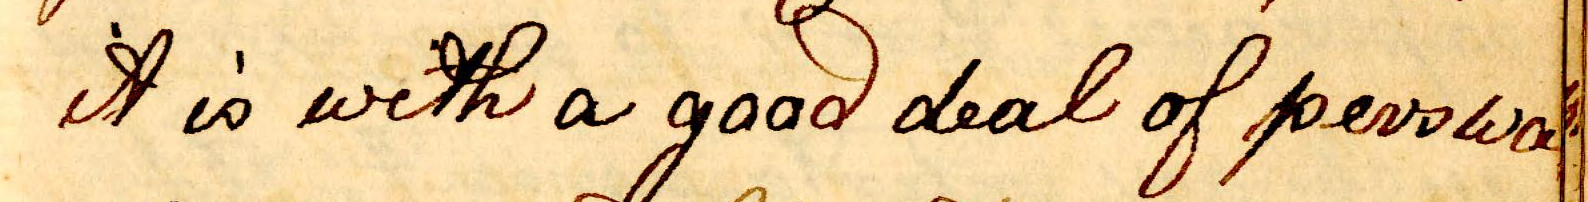it is with a good deal of perswa
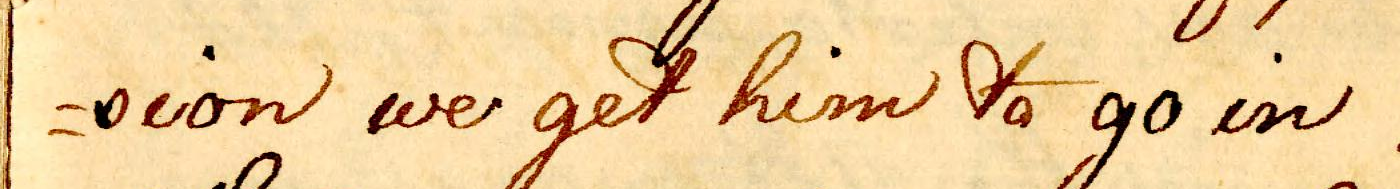-sion we get him to go in
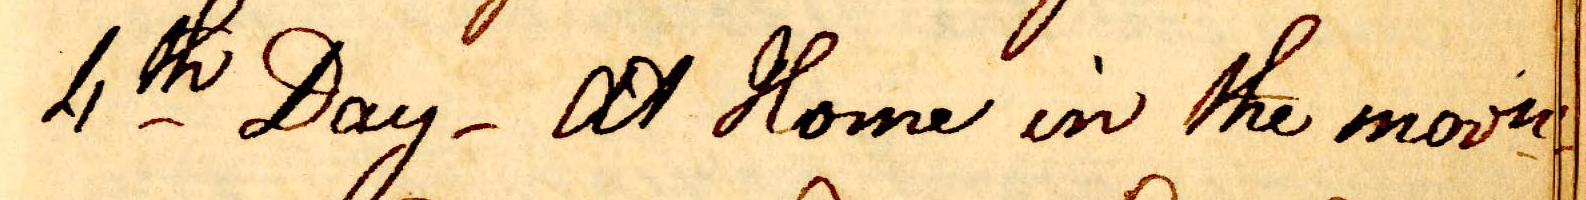4^th Day- At Home in the mor^n
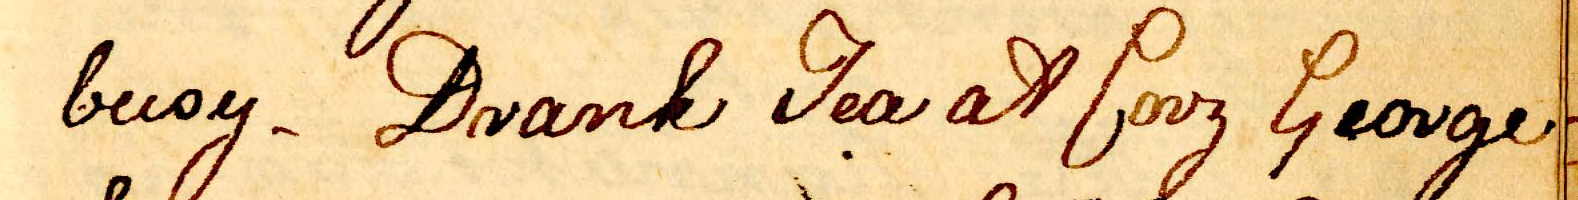busy- Drank Tea at Coz George
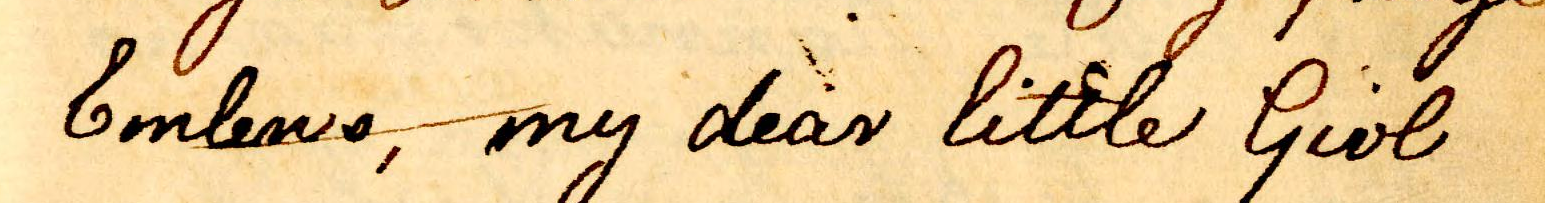Emlens, my dear little Girl
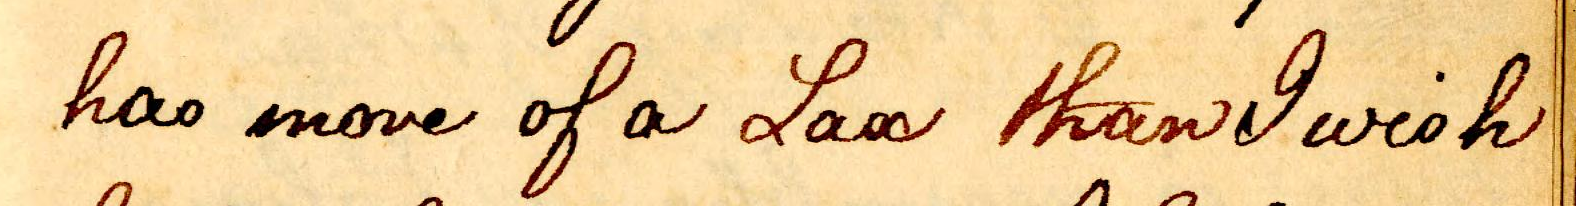has more of a Lax than I wish
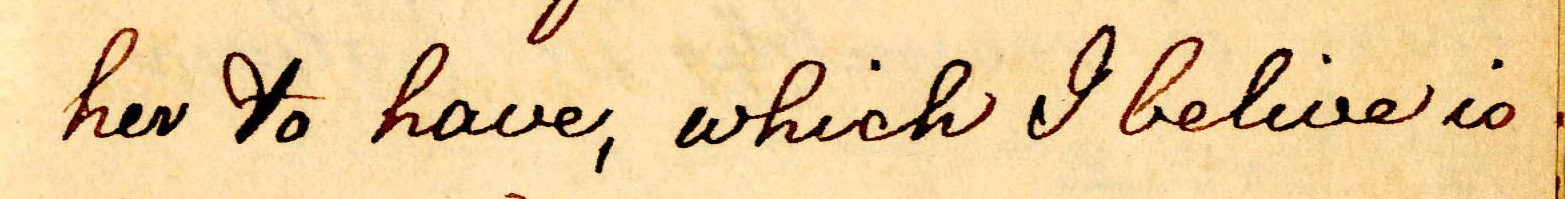her to have, which I belive is
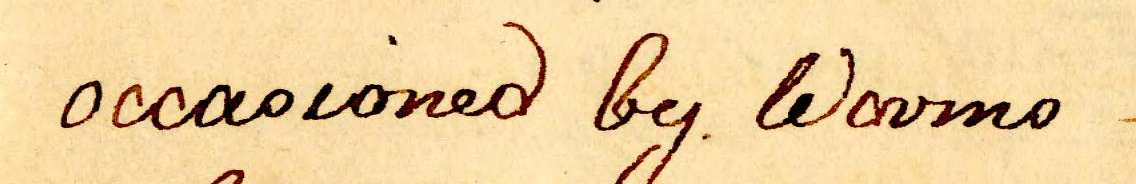occasioned by Worms
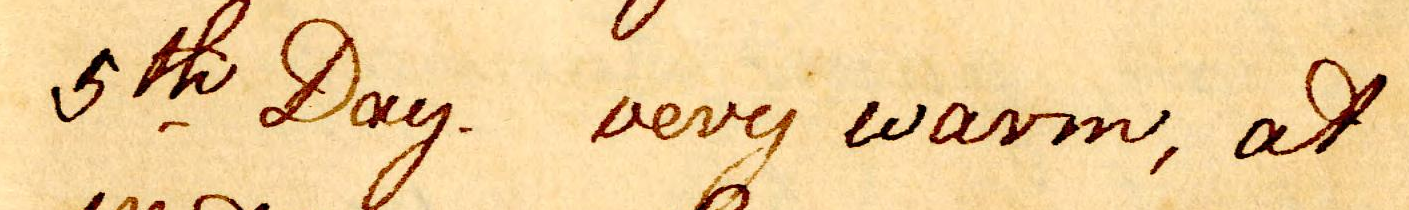5^th Day. very warm, at
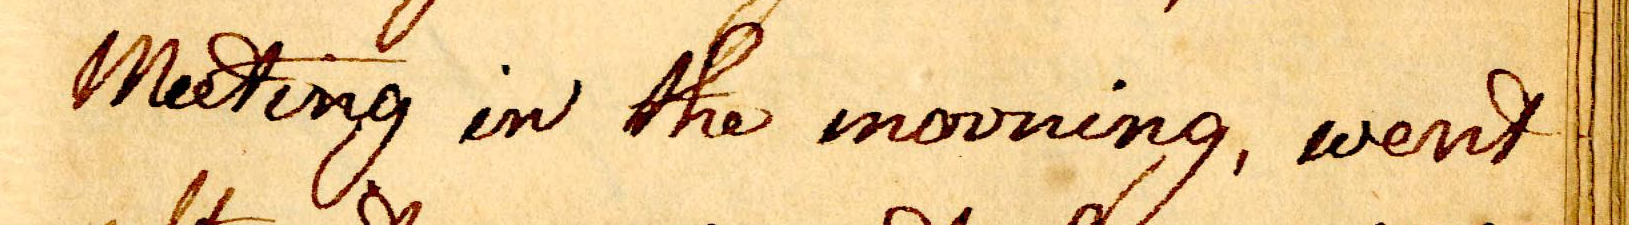Meeting in the morning, went
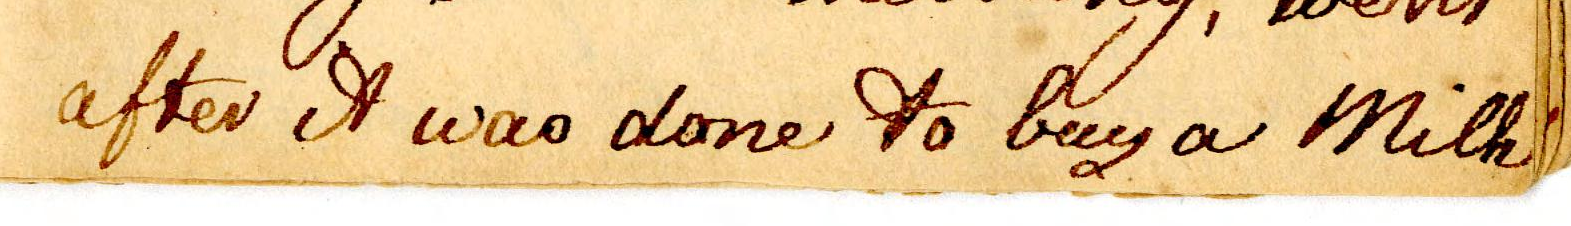after it was done to buy a Milk
